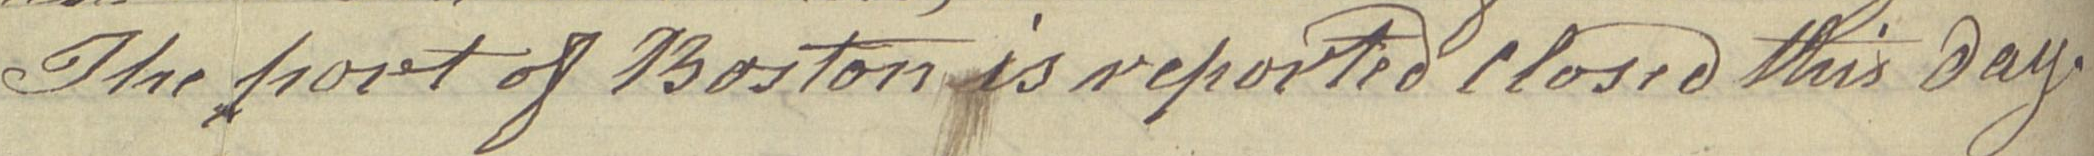The port of Boston is reported closed this day
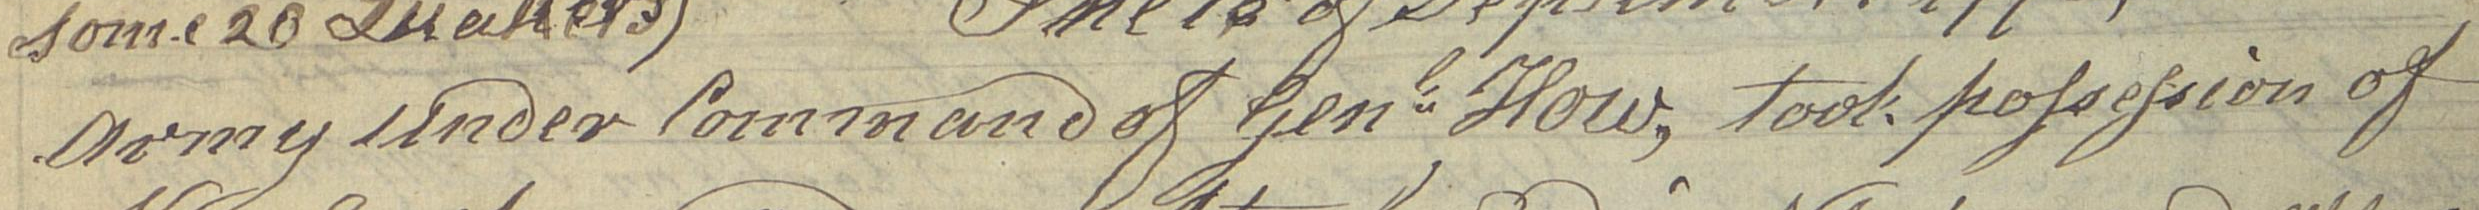Army under Command of Gen^l. How, took possession of
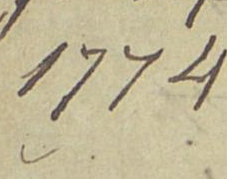1774
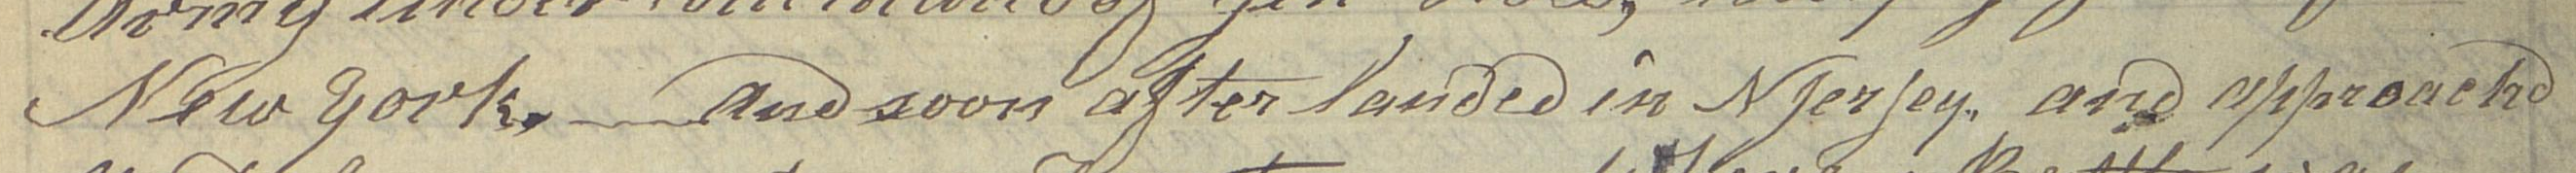New York, and soon after landed in N Jersey, and approached
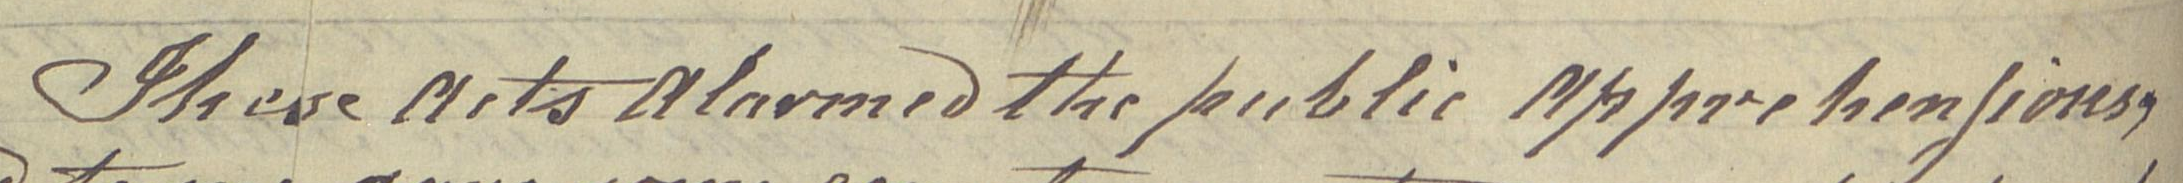These acts alarmed the public apprehensions,
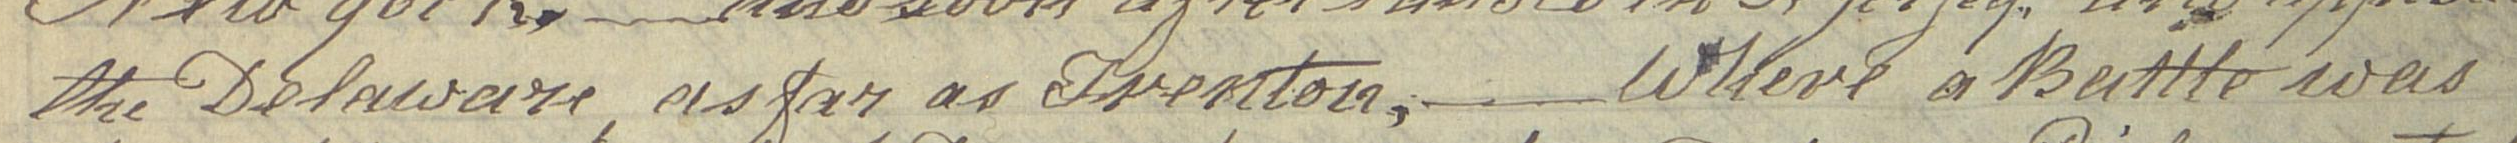the Delaware, as far as Trenton, Where a Battle was
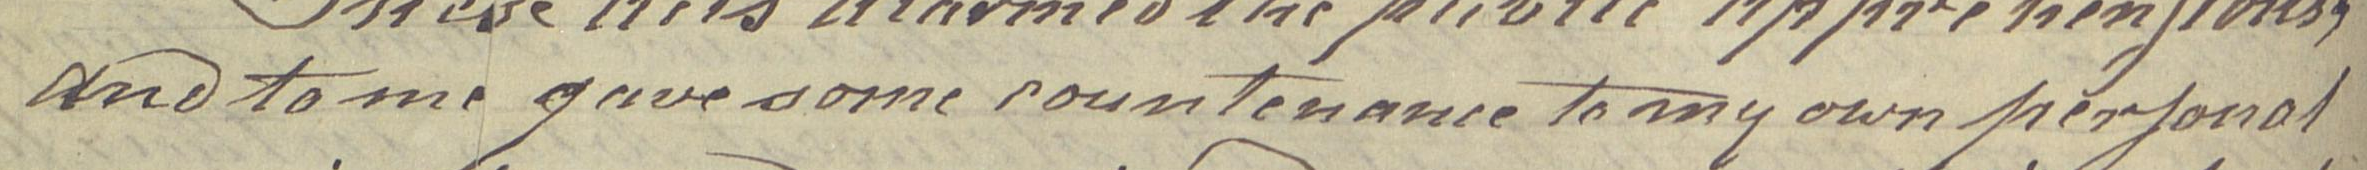And to me gave some countenance to my own personal
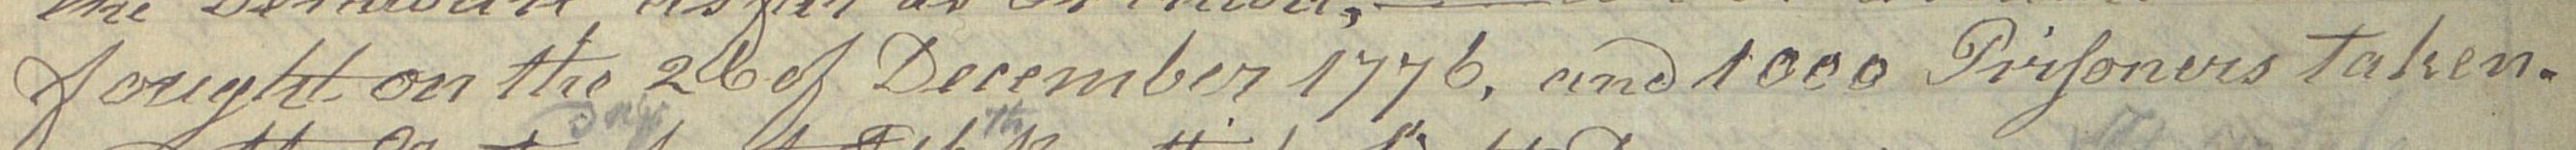fought on the 26 of December 1776, and 1000 Prisoners taken.
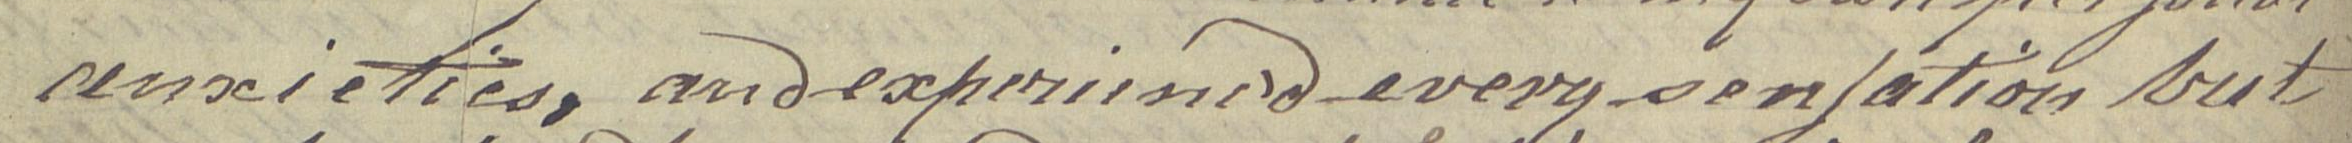anxieties, and experienc'd every sensation but
